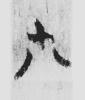{十八}
